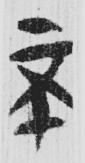不
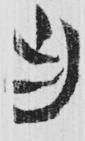出
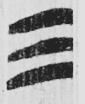三
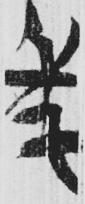年
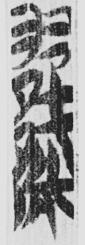○（狄）
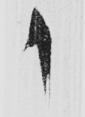人
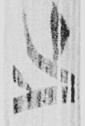之
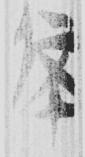伓（附）
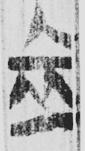者
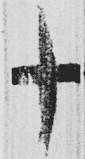七
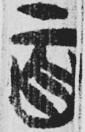百
